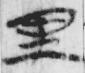里
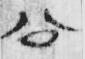公
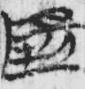○（陽）
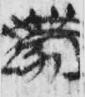勝（勝）
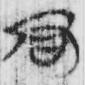君
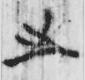之
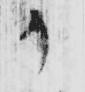人
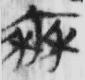秦
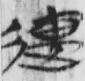連
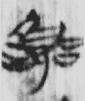囂
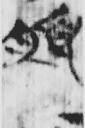○（擾）
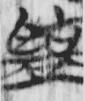○（盬）
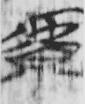虩
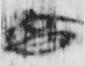亯
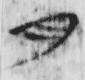月
